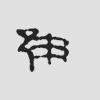隹
